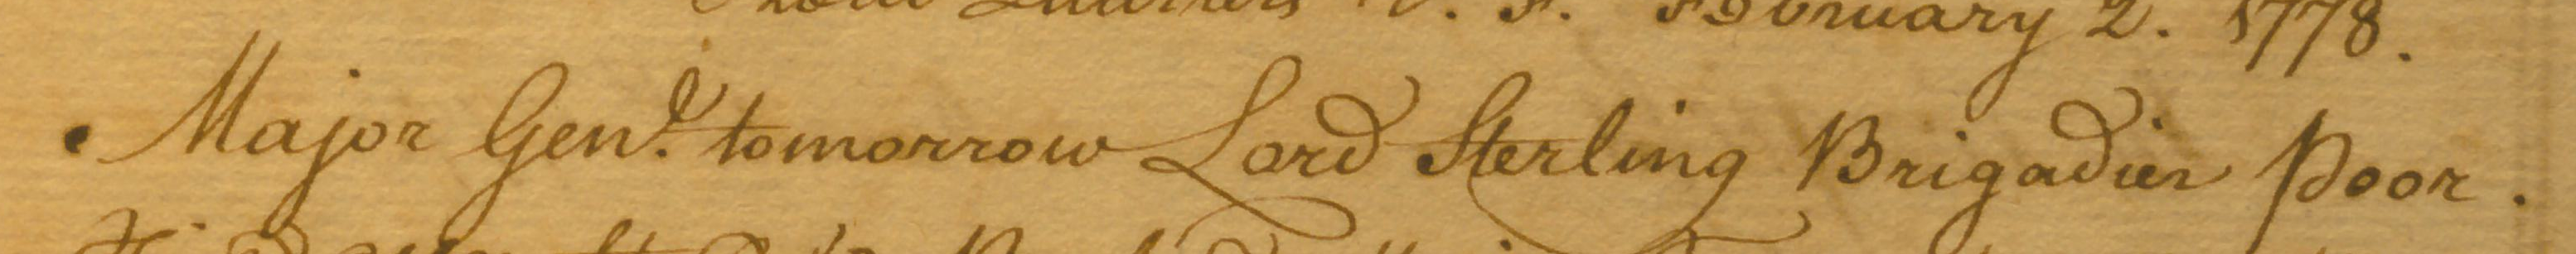Major Gen^l. tomorrow Lord Sterling Brigadier Poor.
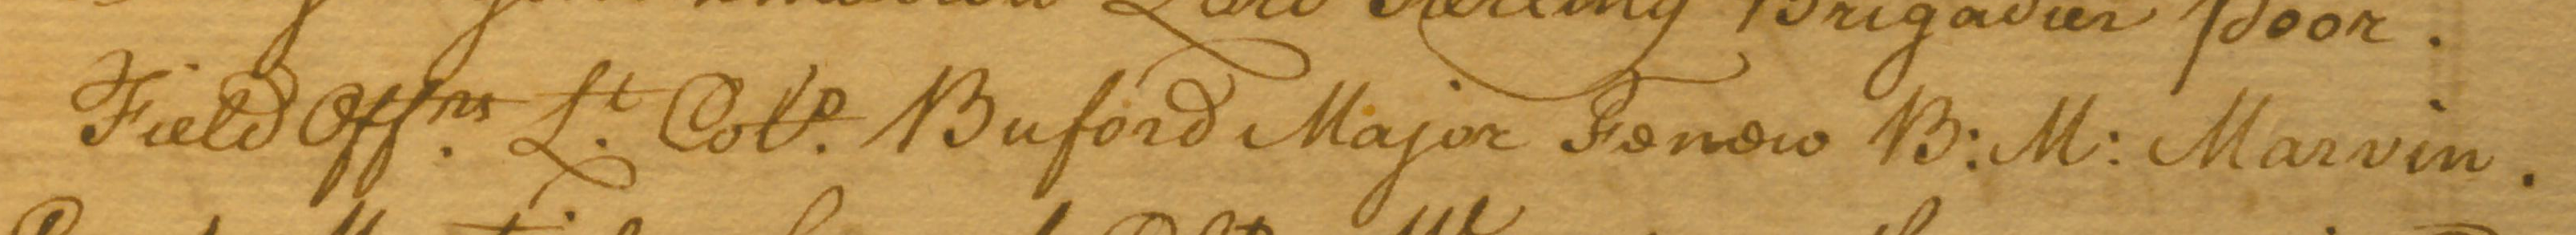Field Off^rs. L^t. Col^o. Buford Major Fenew B: M: Marvin
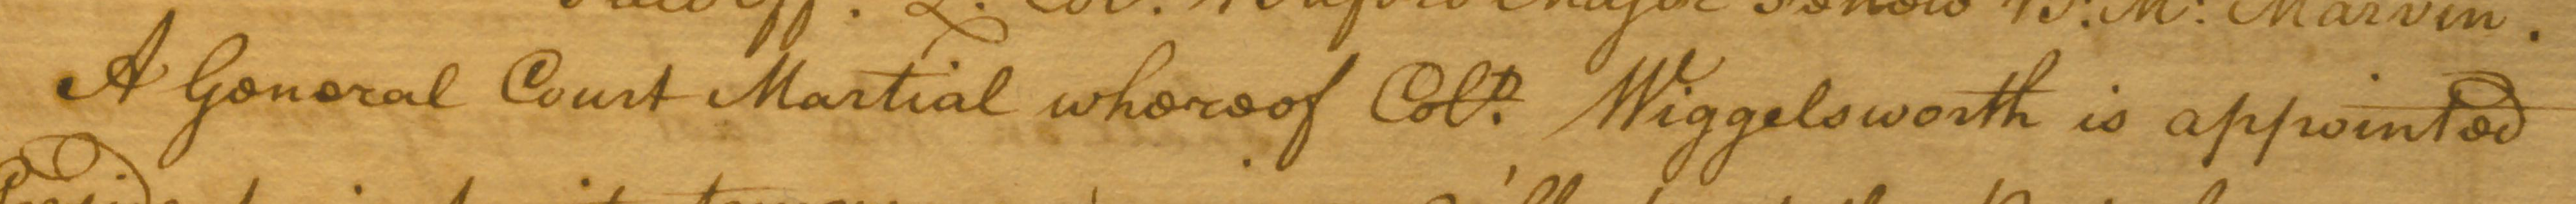A General Court Martial whereof Col^o. Wigglesworth is appointed
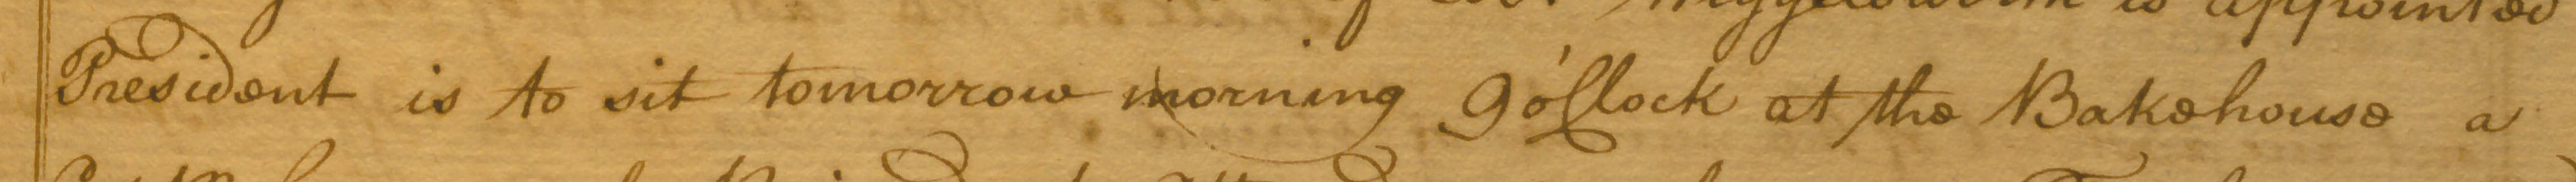President is to sit tomorrow morning 9 o'Clock at the Bakehouse a
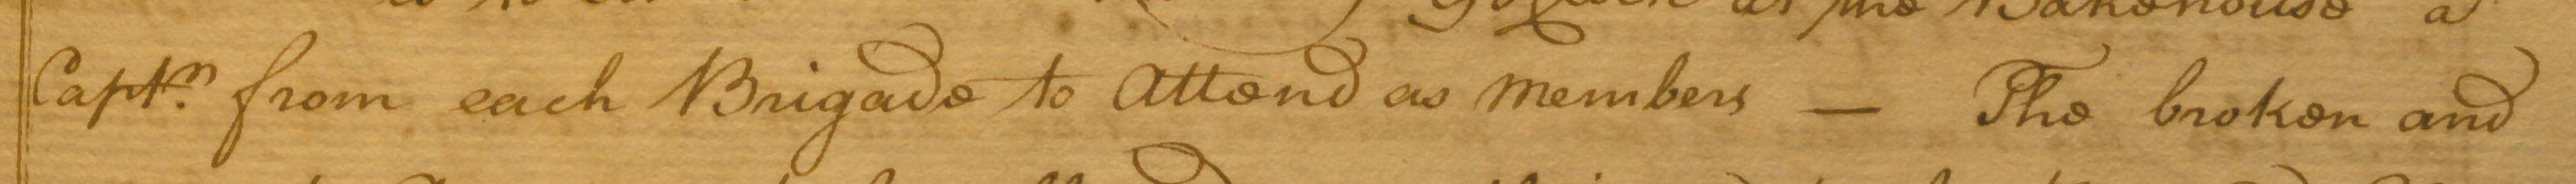Capt^n. from each Brigade to attend as members- The broken and
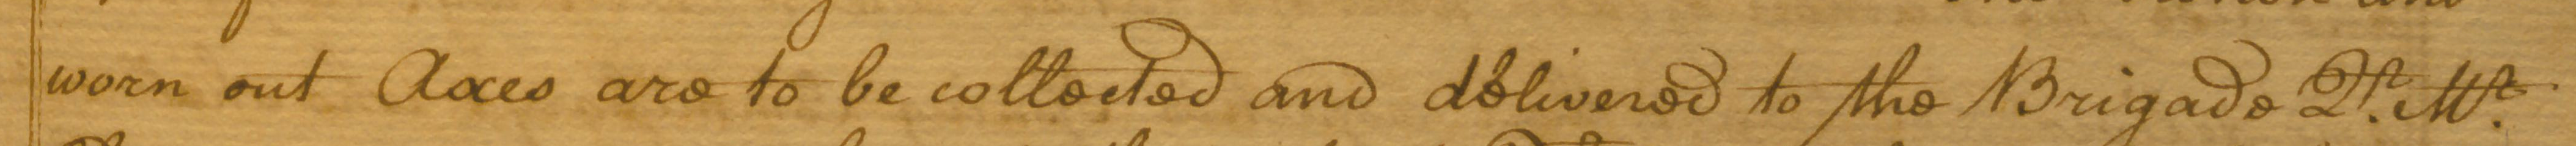worn out Axes are to be collected and delivered to the Brigade Q^r. M^r.
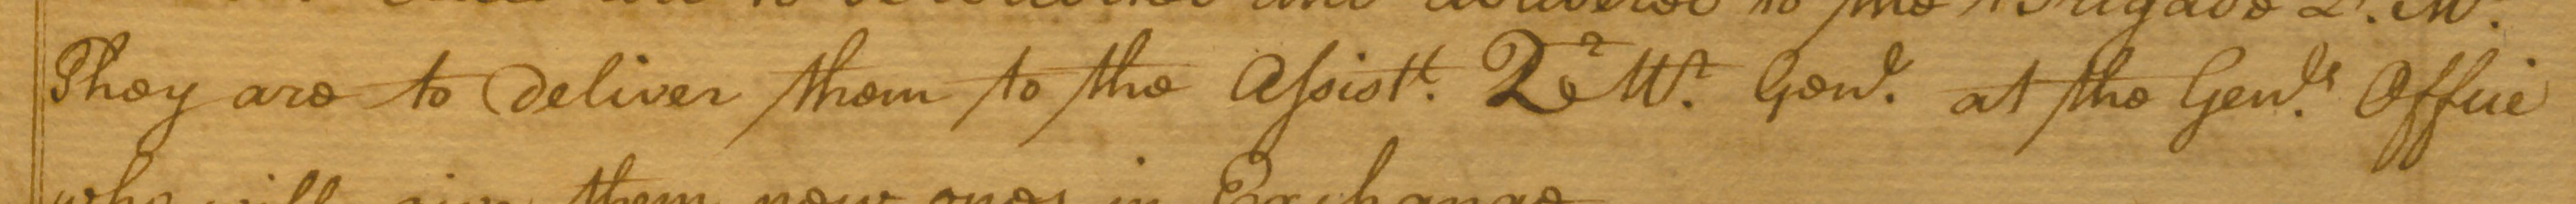They are to deliver them to the Assist^t. Q^r. M^r. Gen^l. at the Gen^ls. Office
